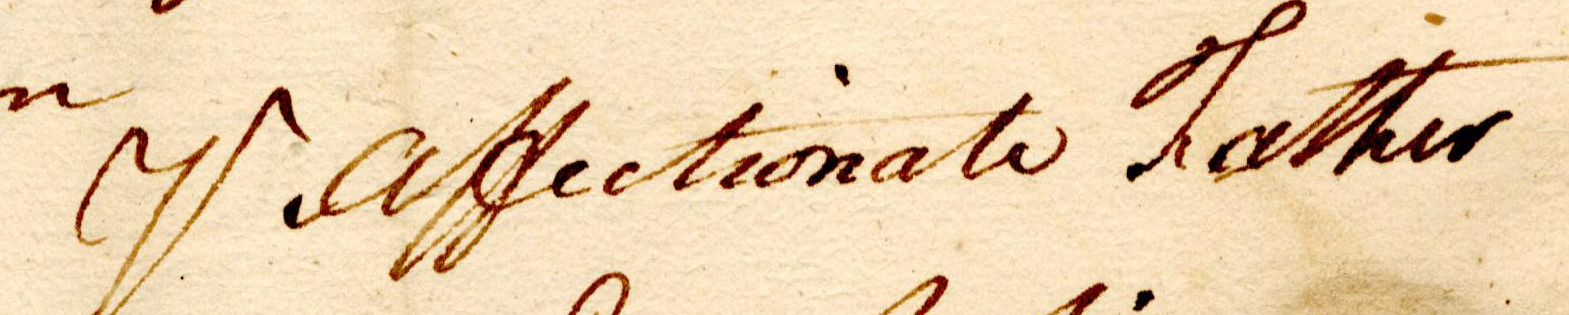Y^r affectionate Father
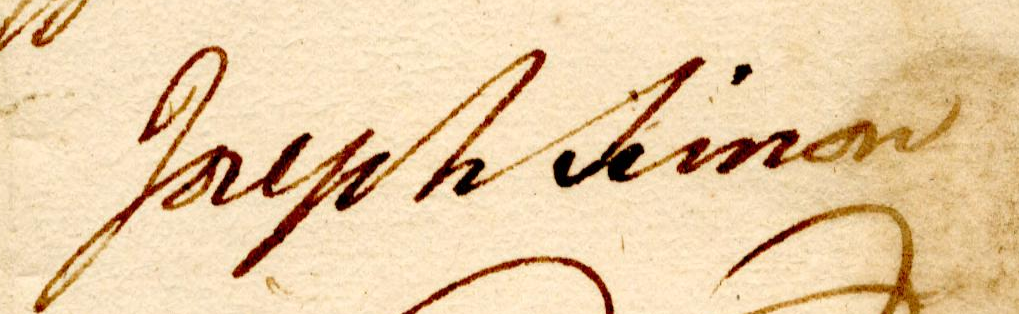Joseph Simon
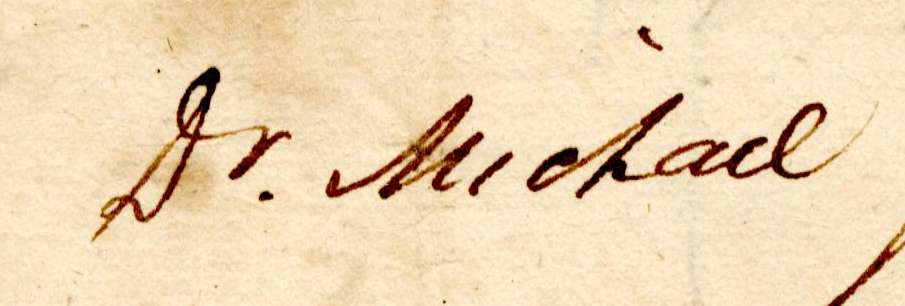D^r. Michael
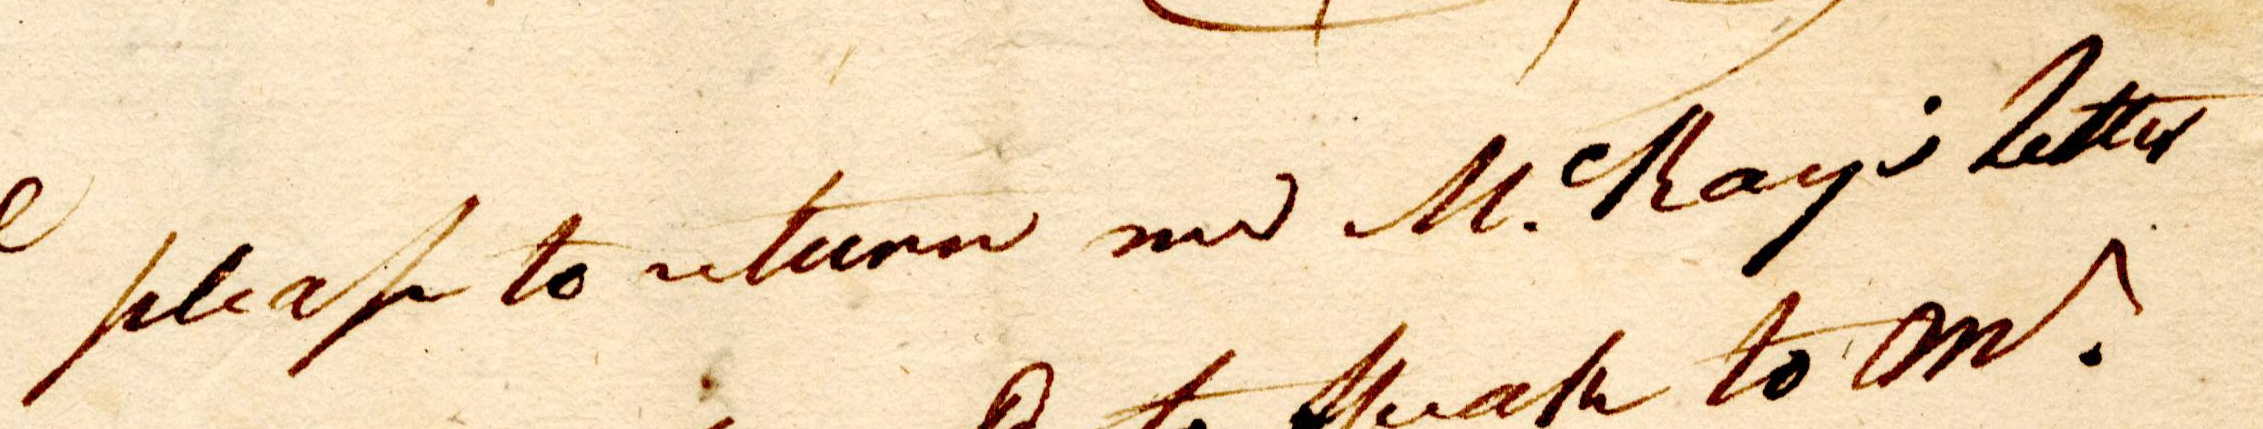please to return me M^c.Kays letter
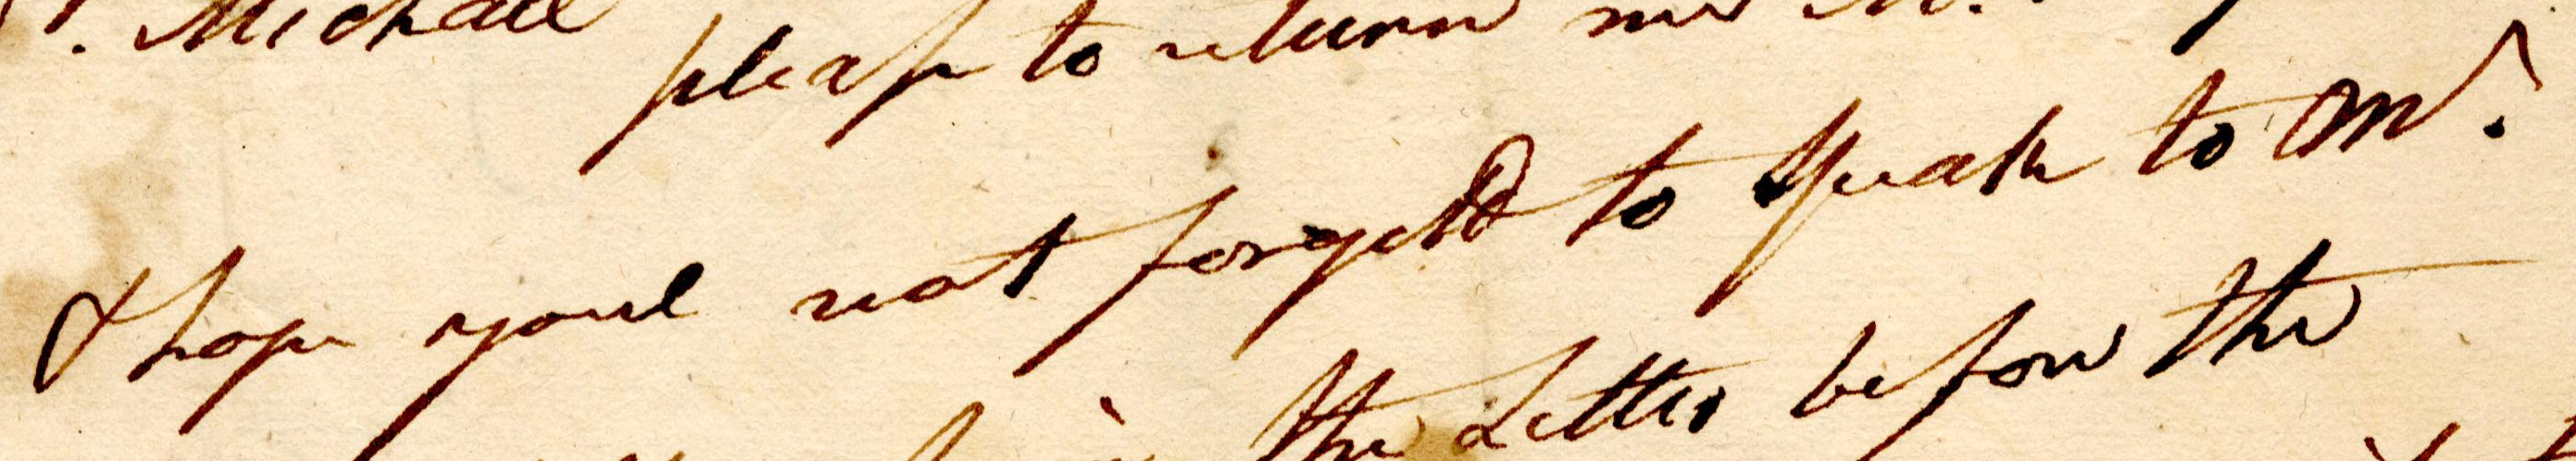& hope youl not forgetd to speak to M^r.
